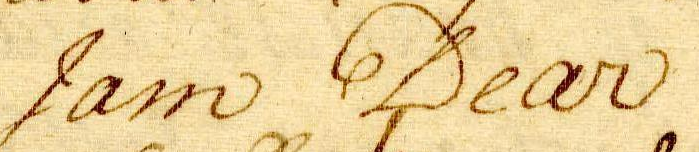I am Dear
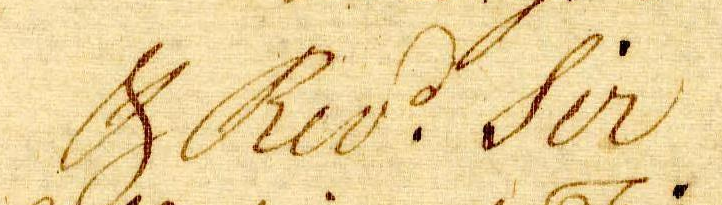& Rev^d. Sir
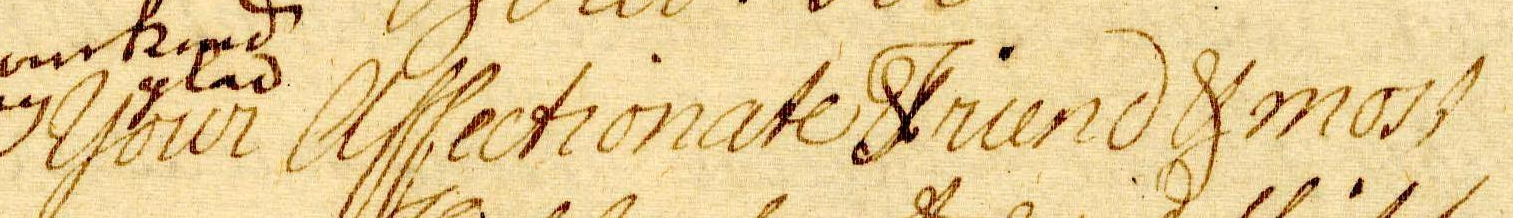Your Affectionate Friend & most
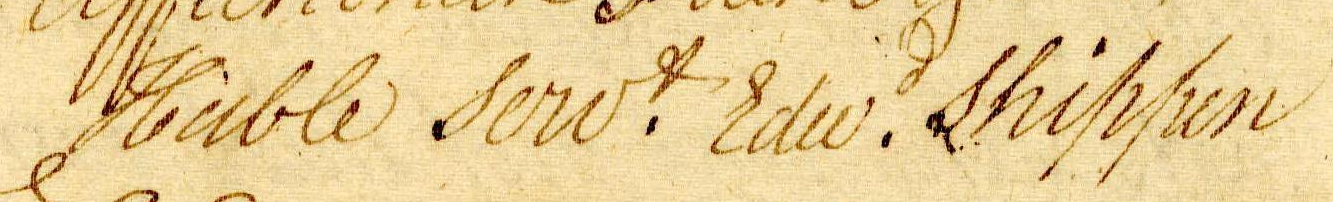Humble Serv^t. Edw^d. Shippen
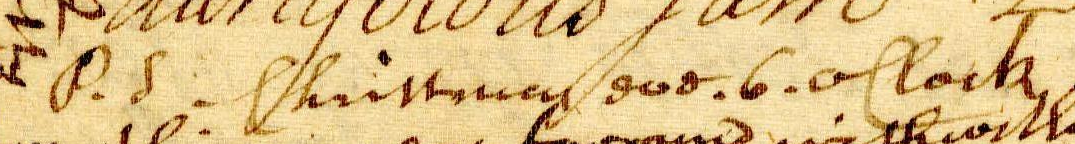P.S- Christmas. eve .6. oClock
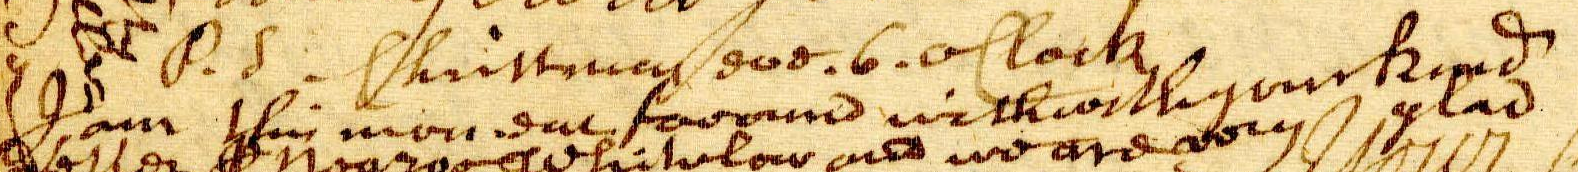I am this {______} forward with with your kind
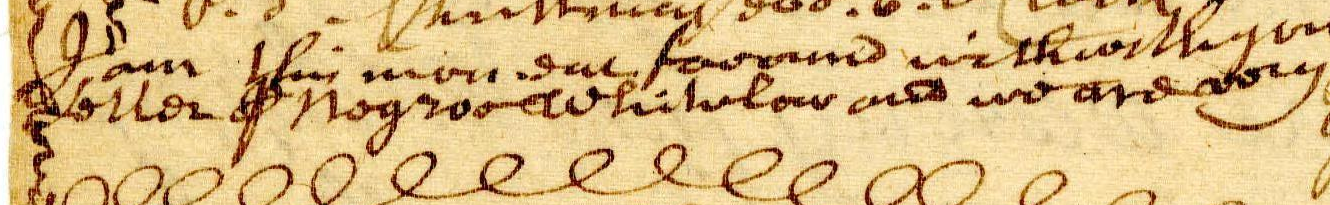Letter per Negro Whitelow and we are very
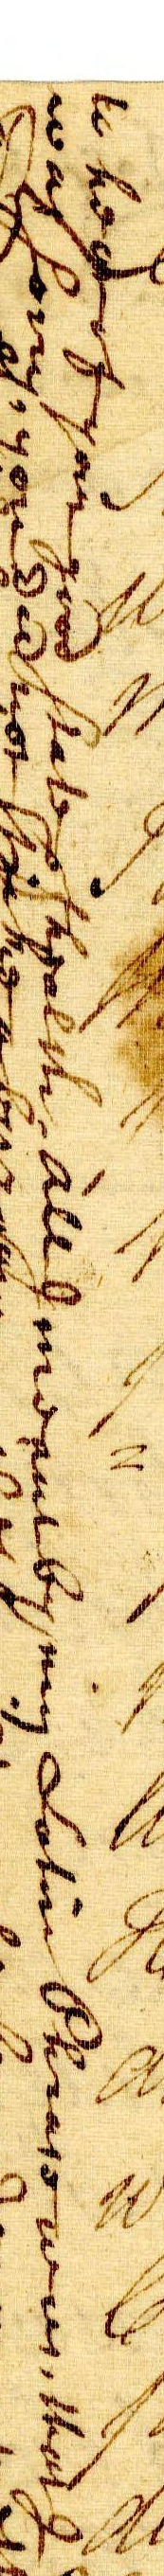to hear of your good State of health. All I meant by my Latin Phrase was, that I
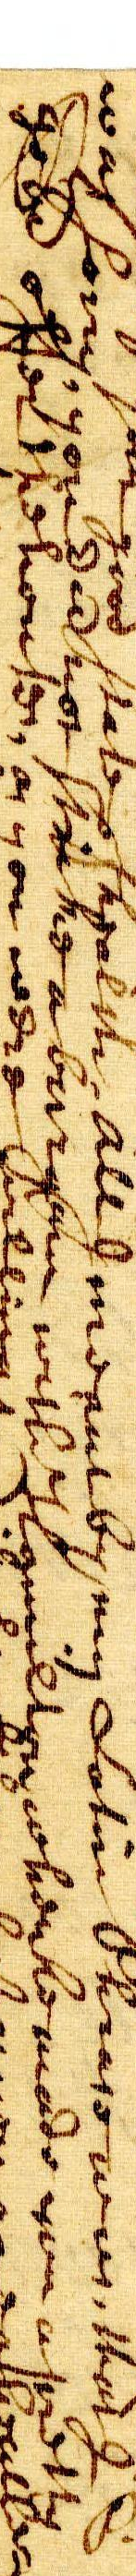was sorry, you did not strike a bargain with Hamilton when he made you a pretty
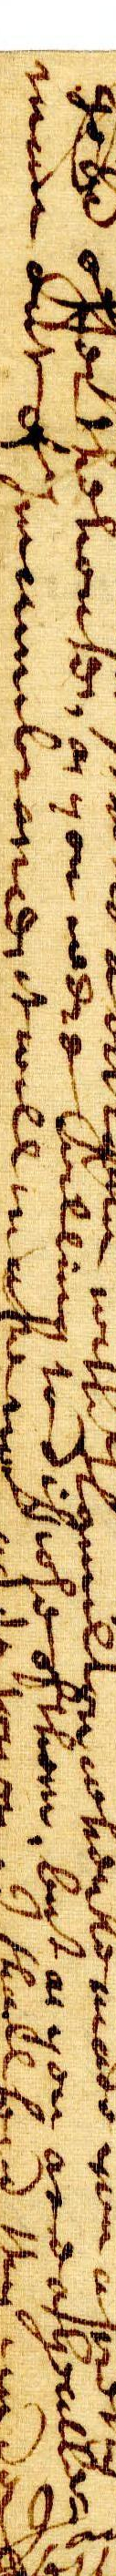go be after the house, as you were willling to dispose of them, but as you are a Gentle-
